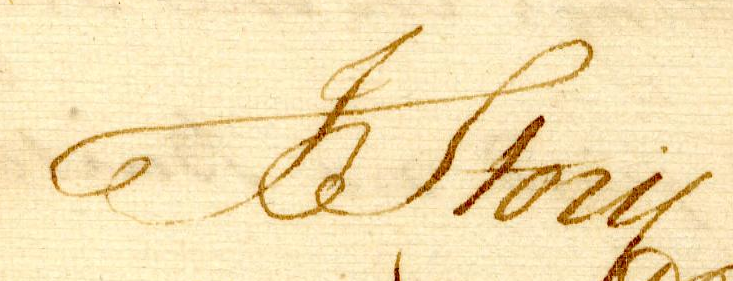J Story
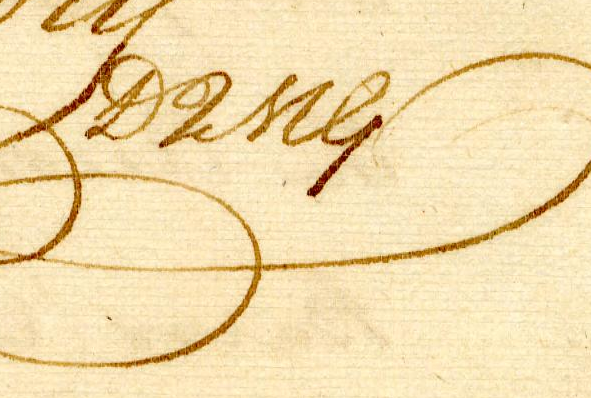DWQ
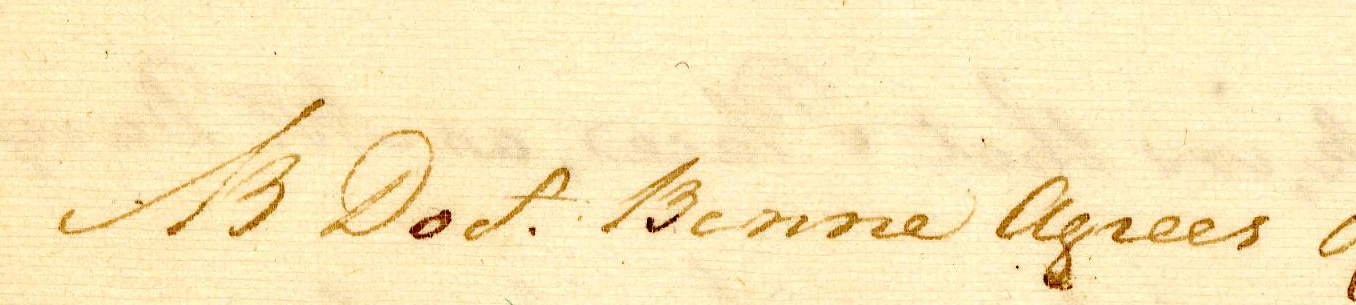NB Doc^r. Benne Agrees
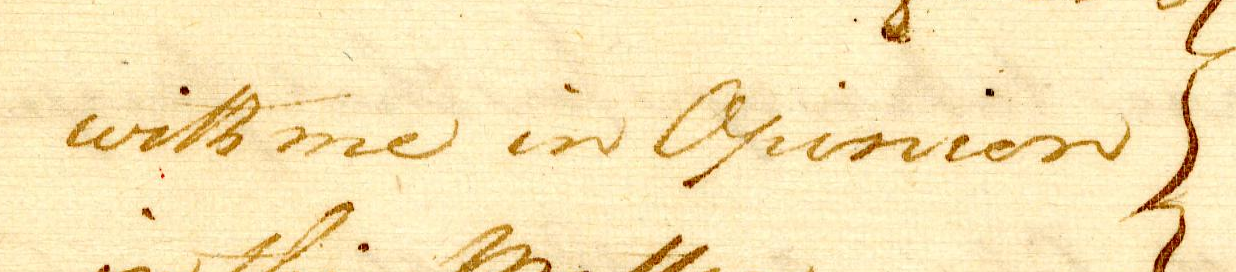with me in Opinion
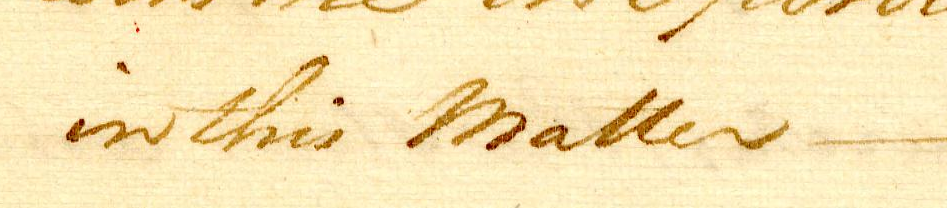in this Matter-
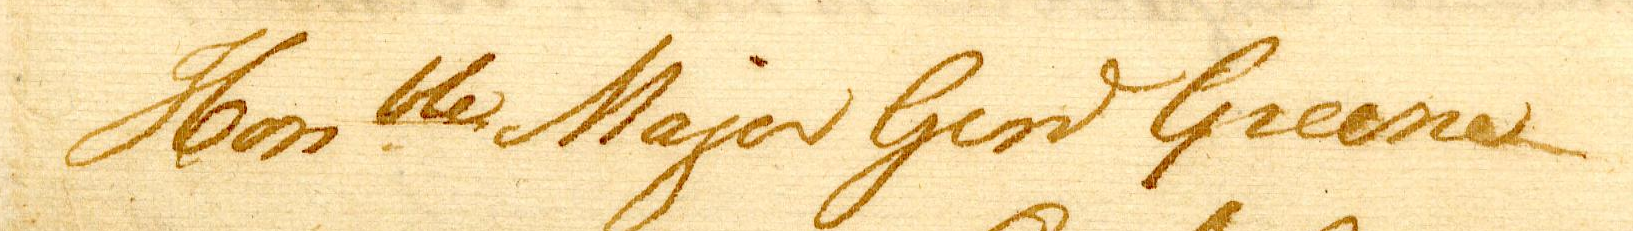Hon^ble Major Gen^l Greene
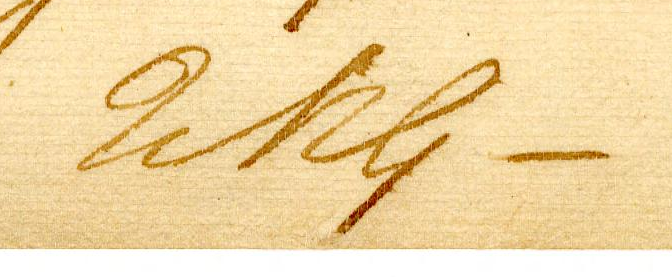QMG-
